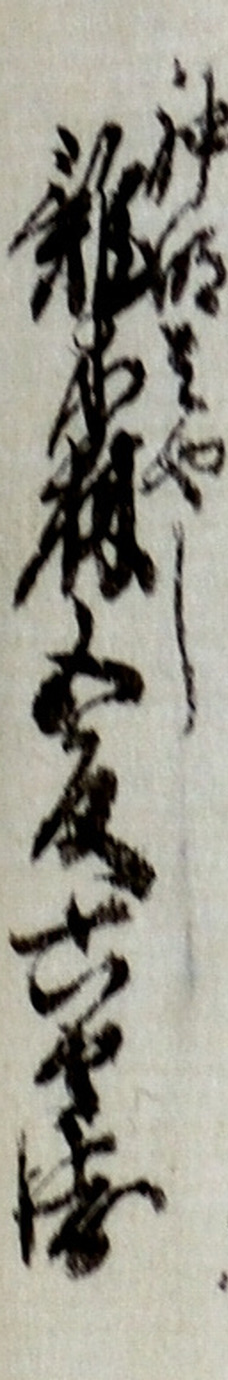雑木林五反六セ歩村中
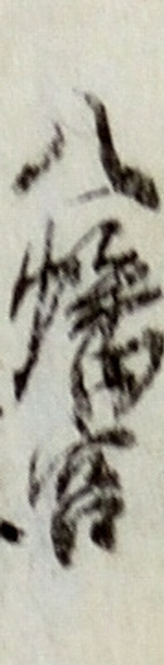八幡宮

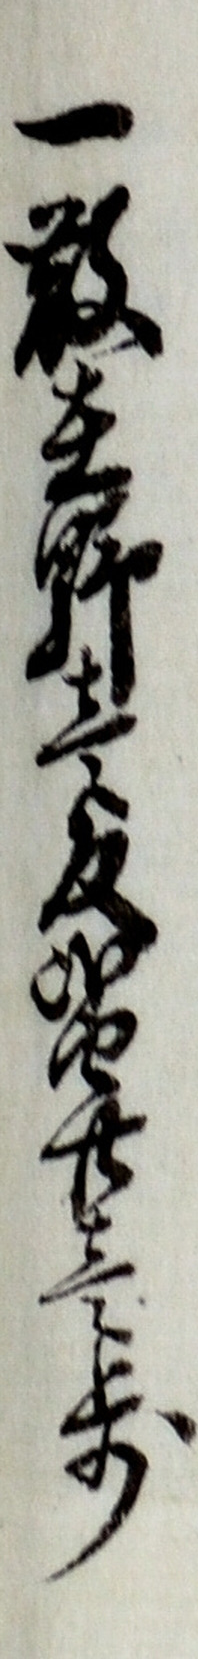一散在野壱反弐セ廿壱歩

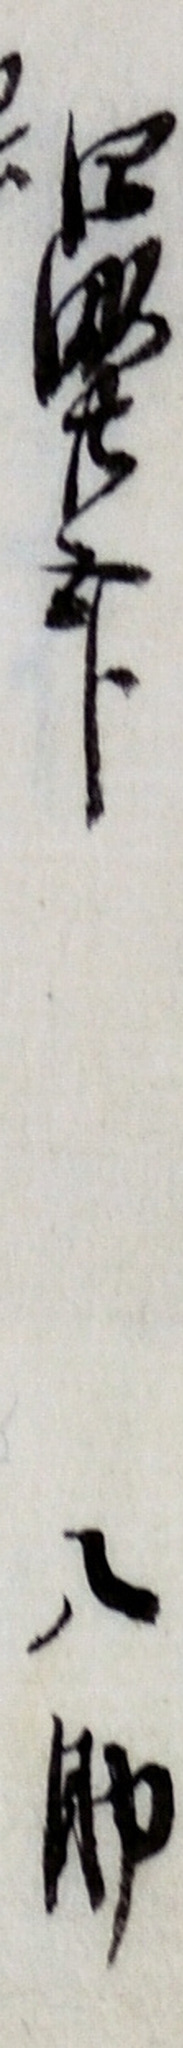四畝廿五歩八助
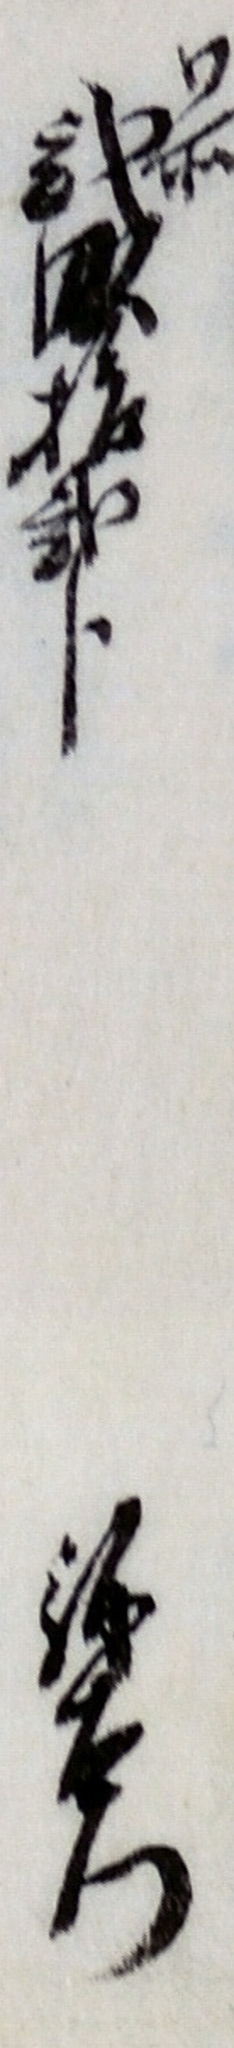弐畝拾弐歩弥右衛門
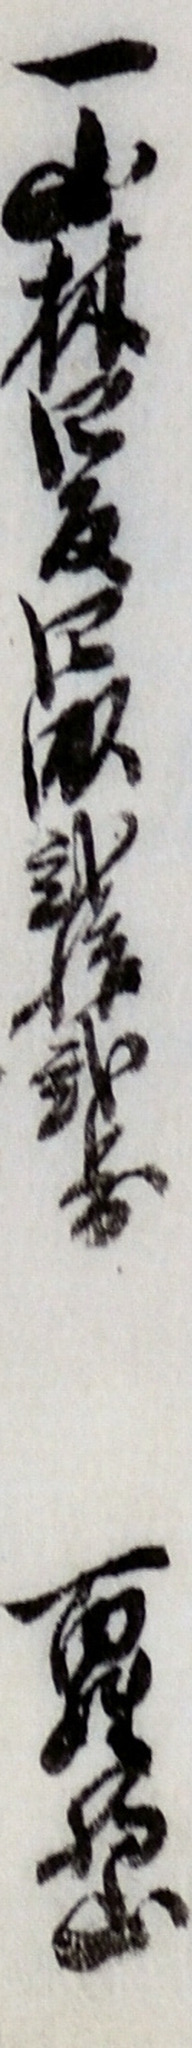一山林四反四畝弐拾弐歩百姓持山
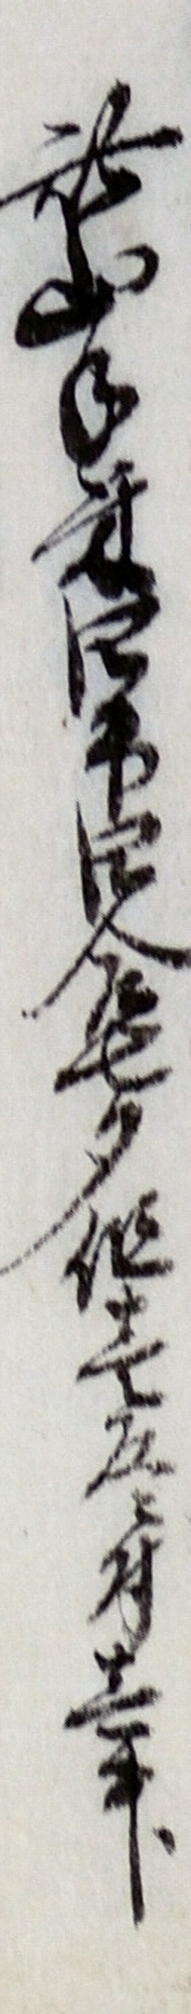此山手米四升四合七勺但壱反ニ付壱升
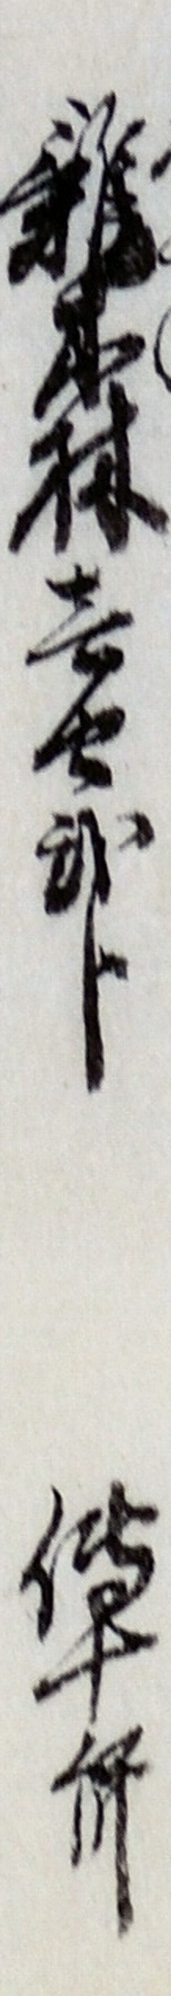雑木林壱セ弐歩伝十郎
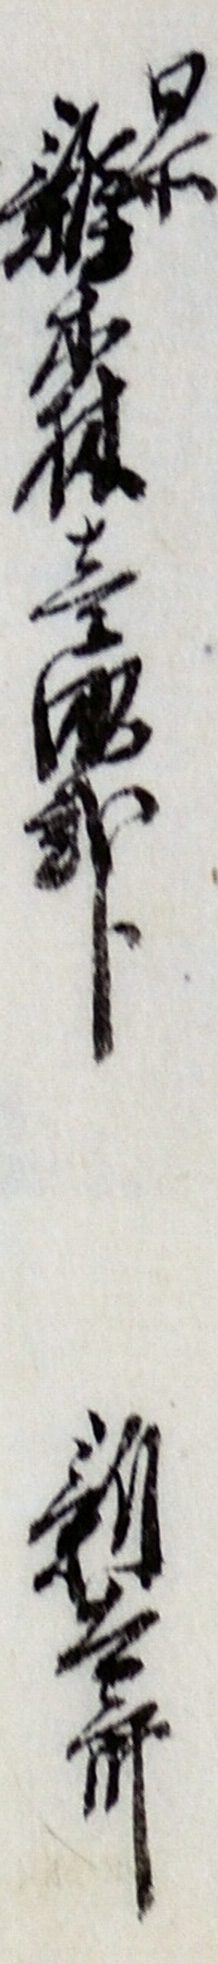雑木林壱畝弐歩新太郎
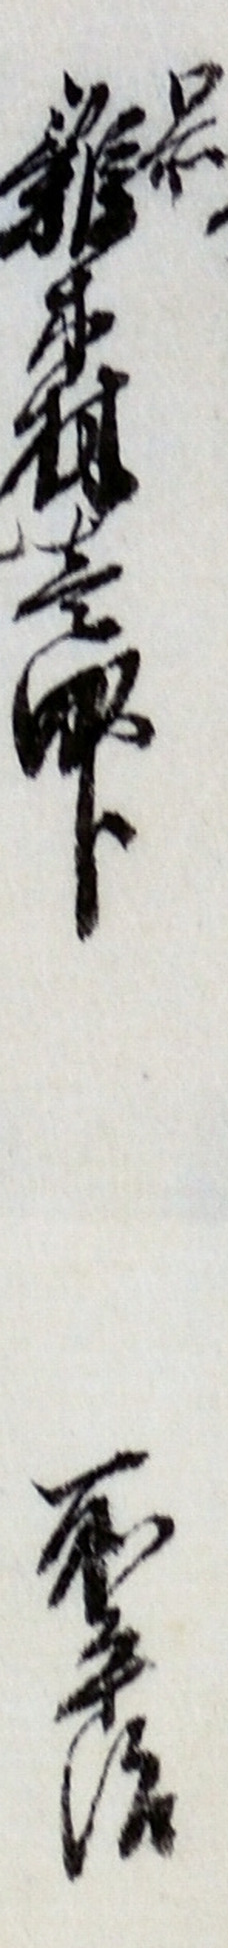雑木林壱畝歩所平治
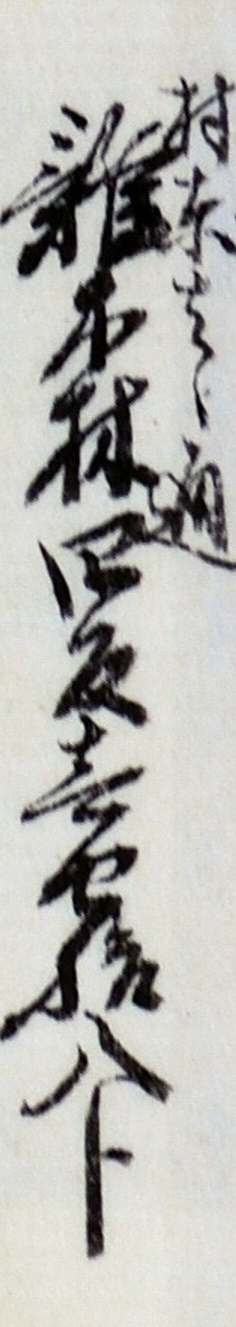雑木林四反壱セ拾八歩村中
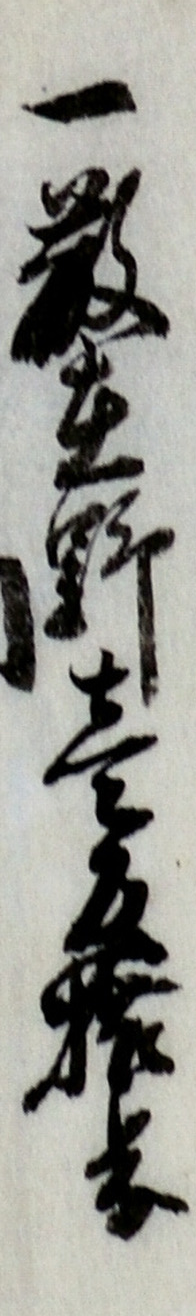一散在野壱反拾歩

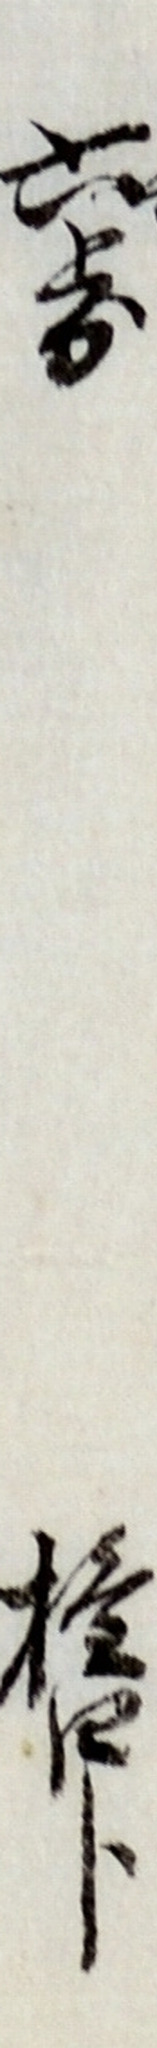六歩権四郎
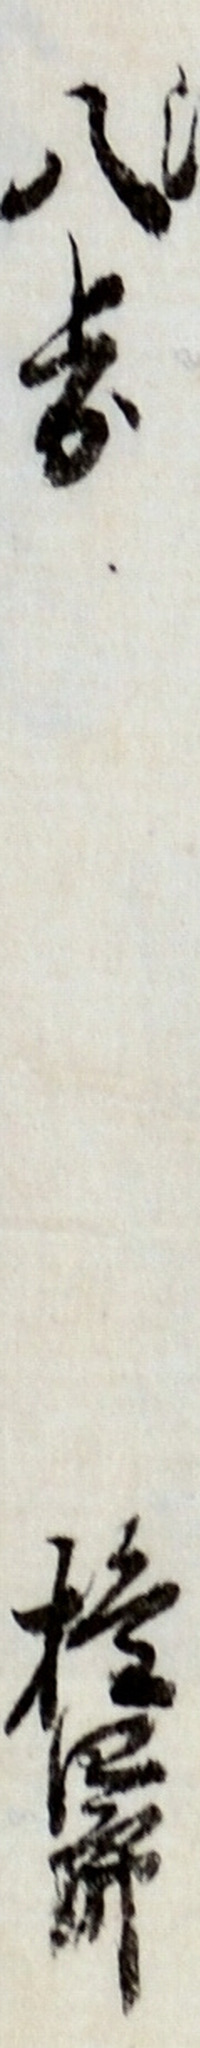八歩権四郎
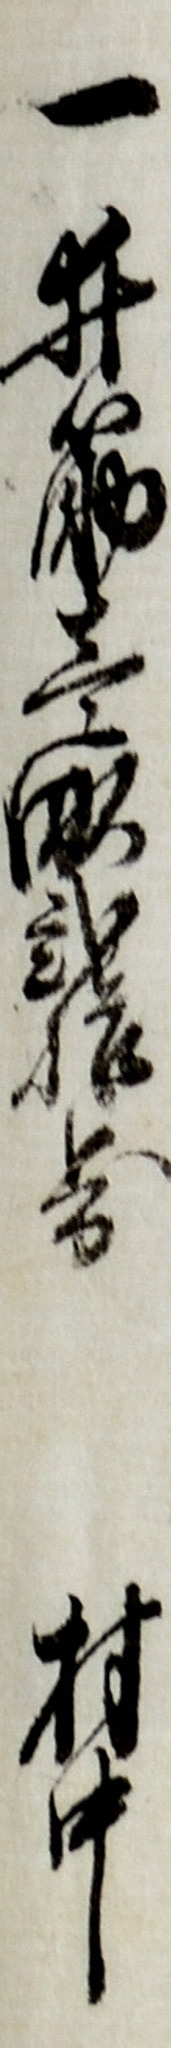一井筋一畝弐拾歩村中
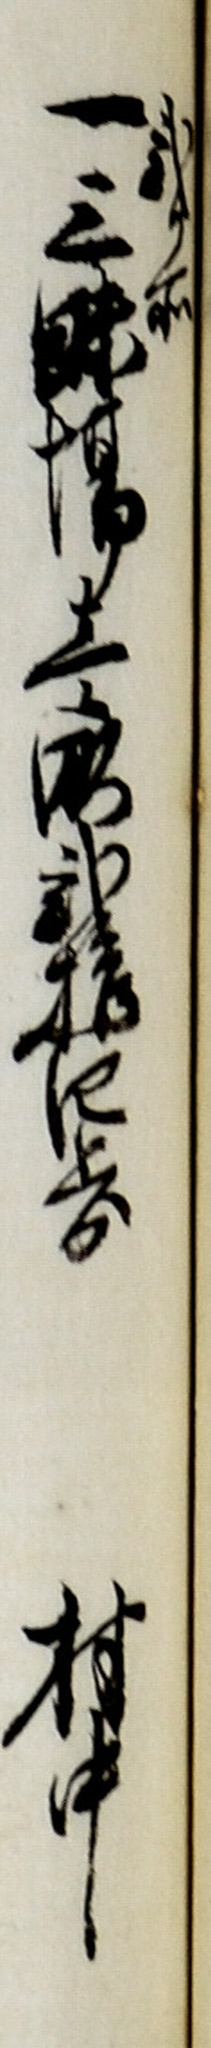一三昧場壱畝弐拾四歩村中
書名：御領分中山林社地手控
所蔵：伊那市立高遠町図書館・合同会社AMANE
